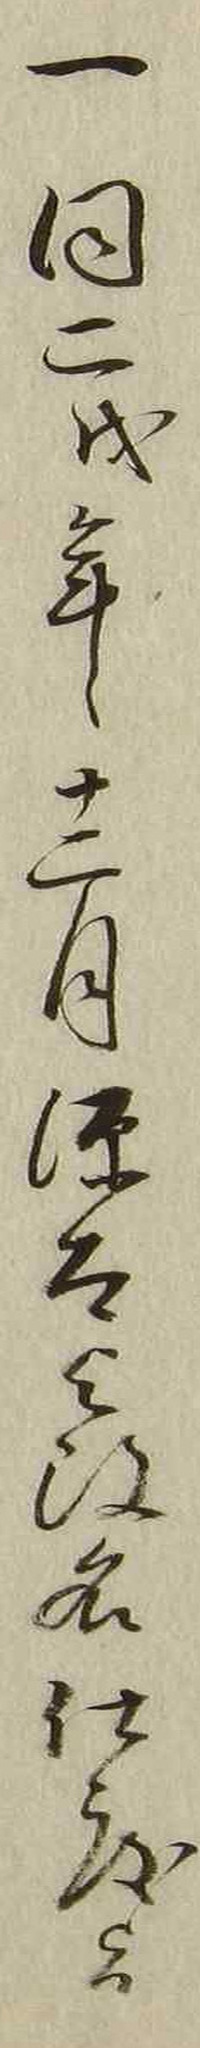一同二戌年十二月源太と改名仕り度旨
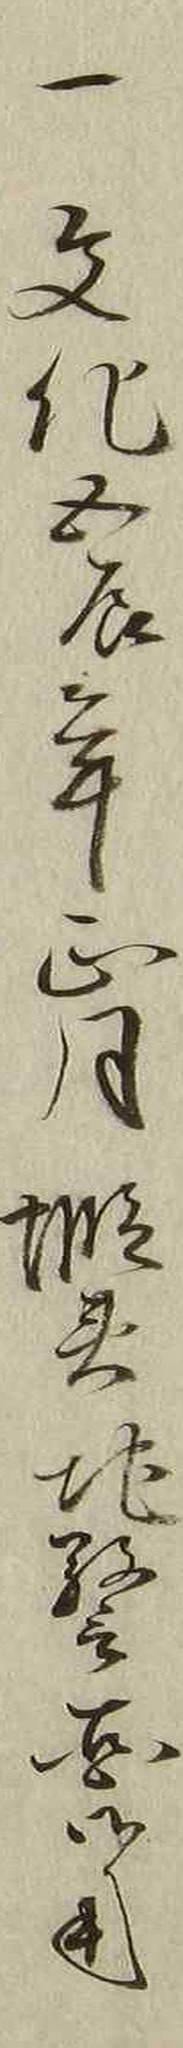一文化五辰年正月蝦夷地警固御用
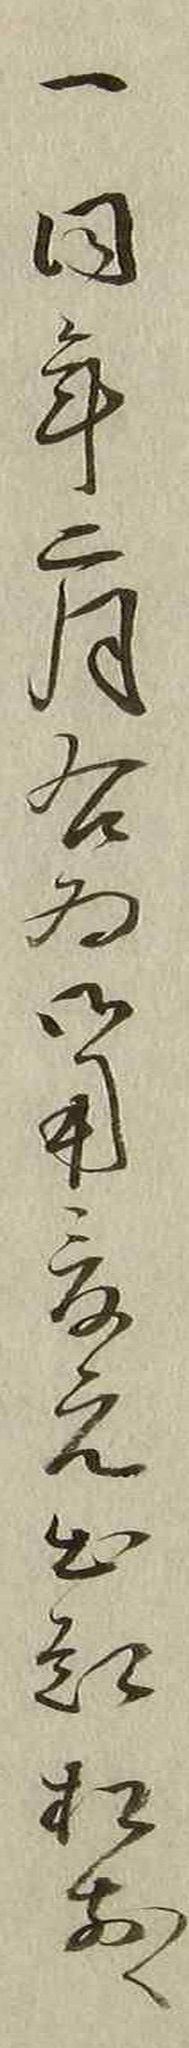一同年二月右御用之為爰元出精松前へ
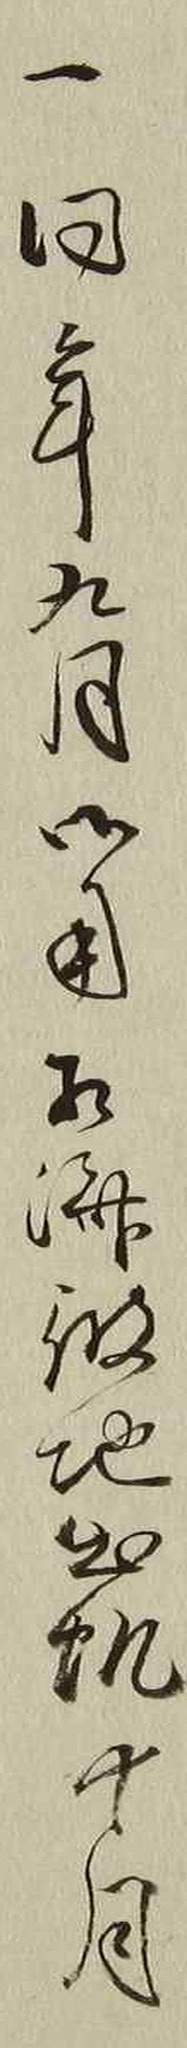一同年九月御用相済彼地出帆十月
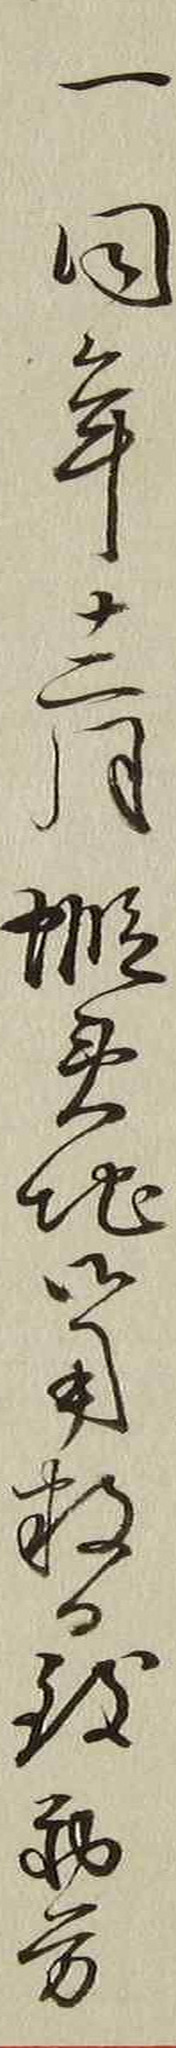一同年十二月蝦夷地御用数日勤労致し
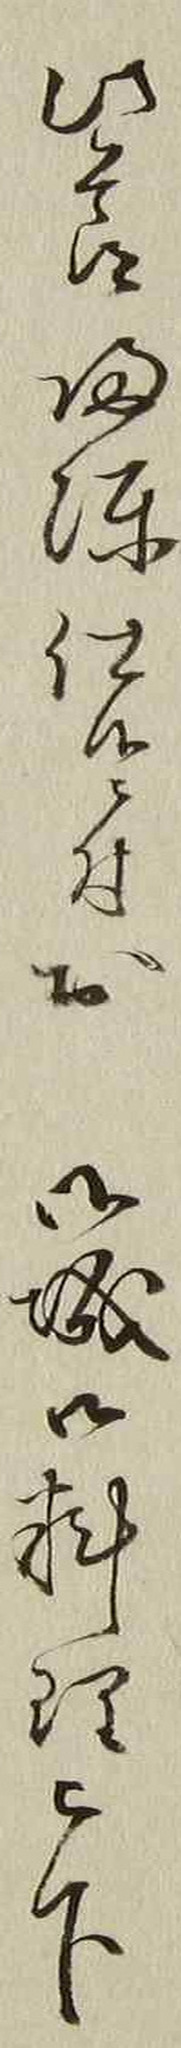此節帰陣仕り候ニ付き御城御料理下し
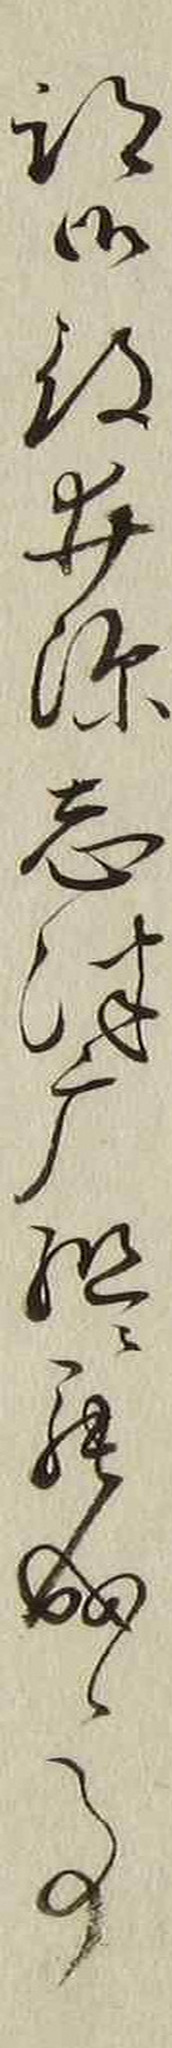跡御役井深志津摩組ニ罷り成り候事
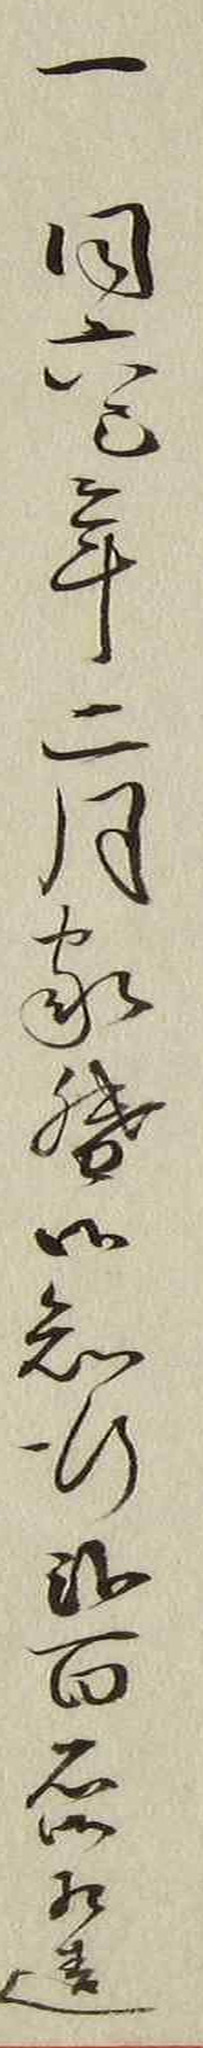一同六巳年二月家督御知行弐百石御相違
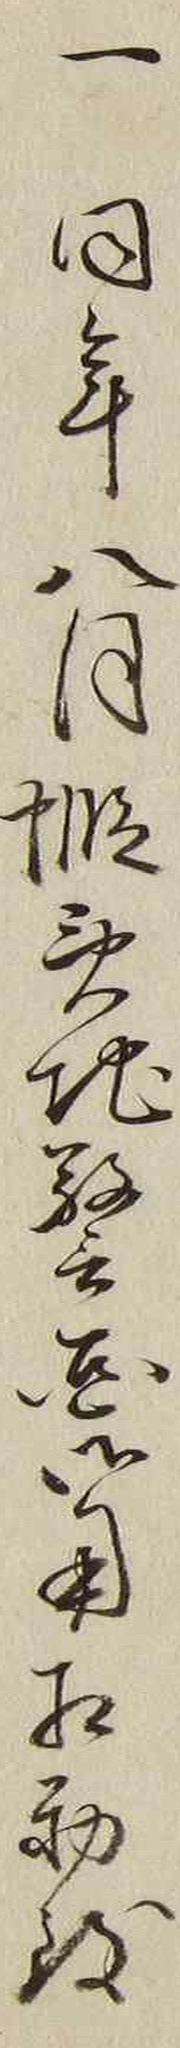一同年八月蝦夷地警固御用相勤め

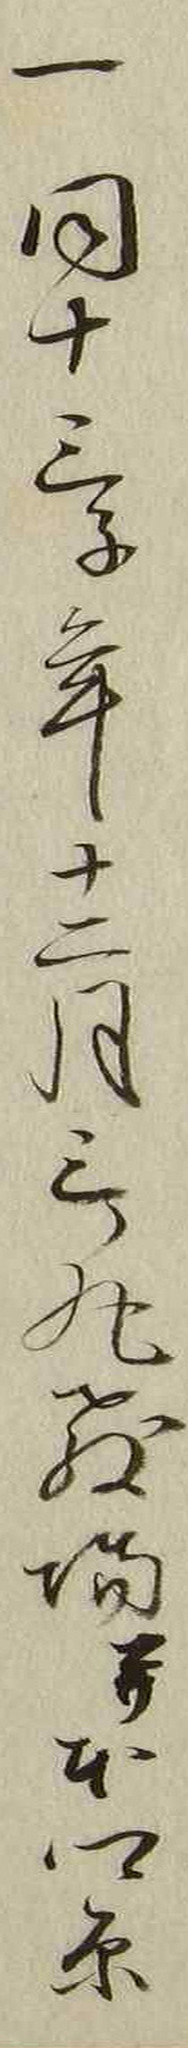一同十三子年十二月三ノ丸の内教場幷本郷原
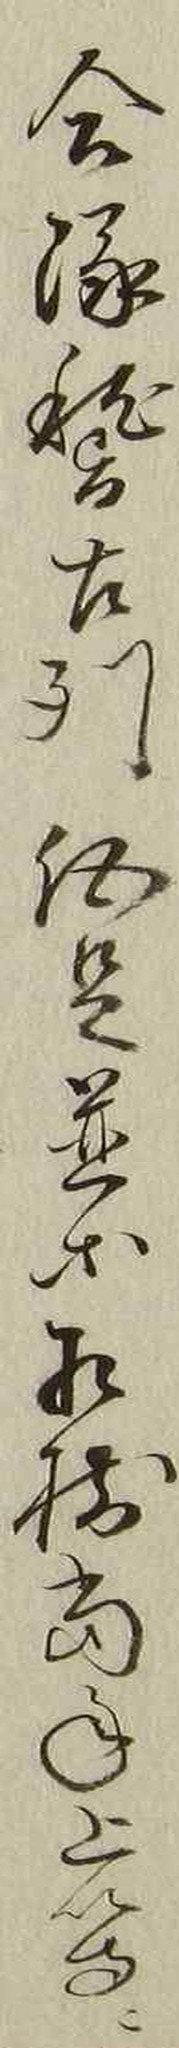合隊稽古列伍足並等相揃え当年上等ニ
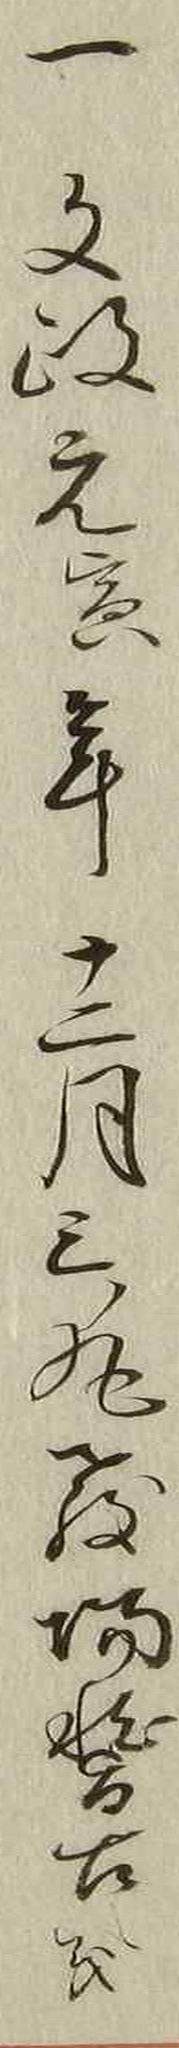一文政元寅年十二月三ノ丸教場稽古義
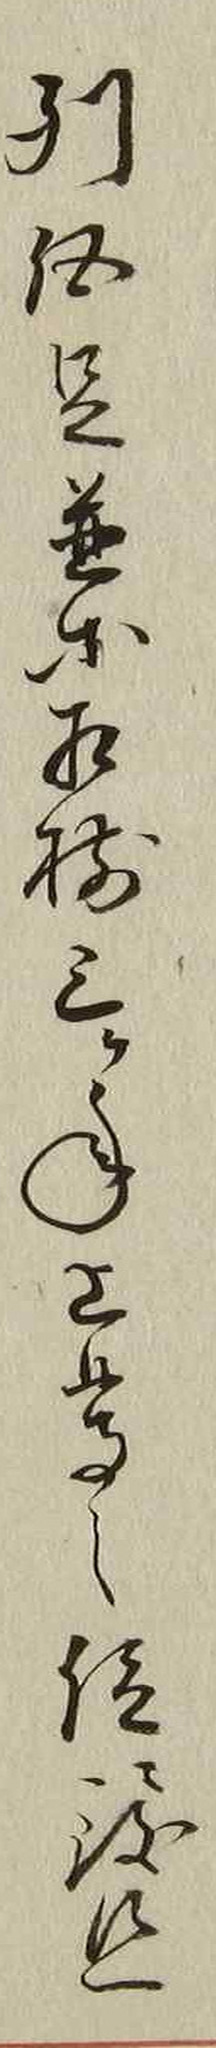列伍足並等相揃え三ケ年上等之位ニ致し且つ
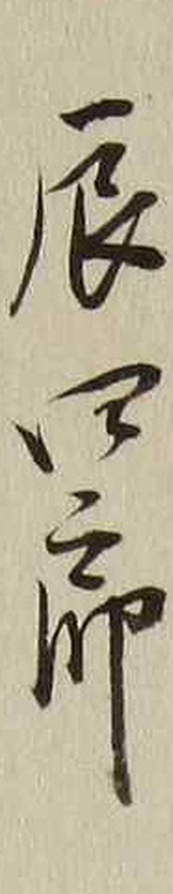辰四郎
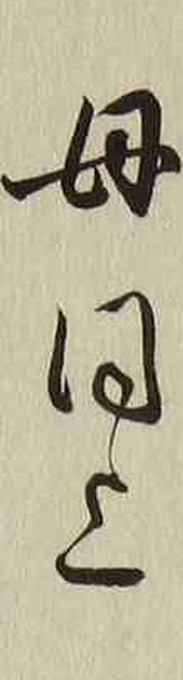母同上
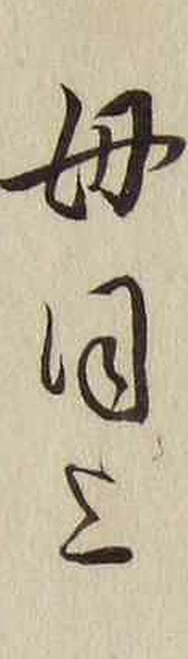母同上
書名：諸士系譜　巻之20　い之部20
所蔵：会津若松市立会津図書館
